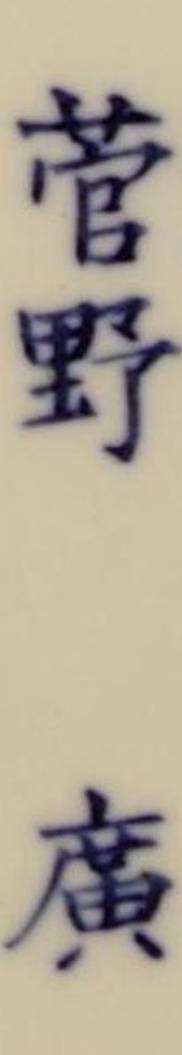菅野廣
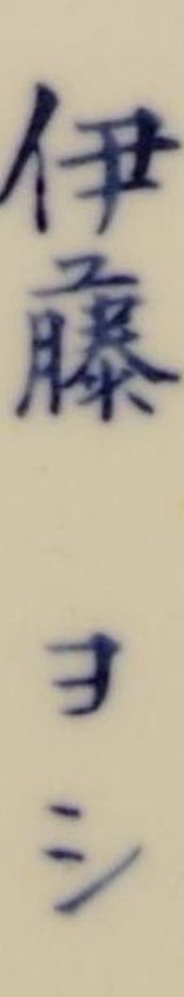伊藤ヨシ
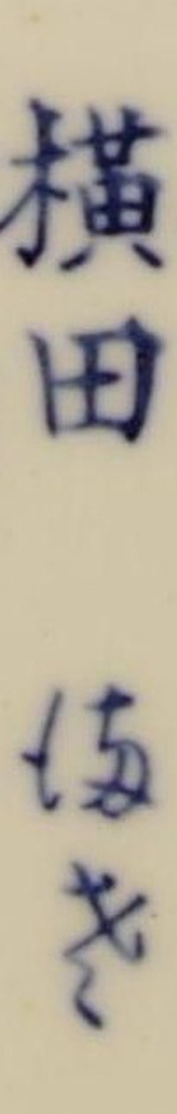横田まさ
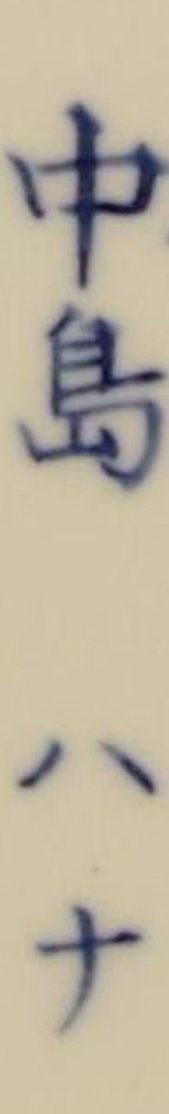中島ハナ
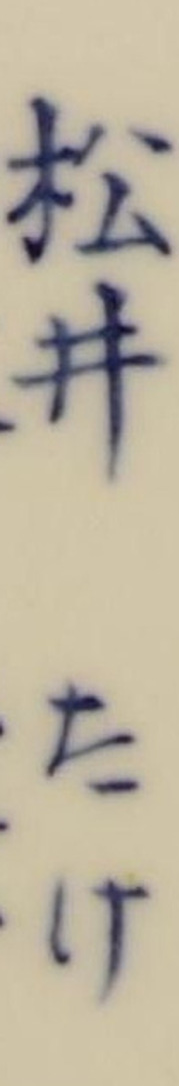松井たけ
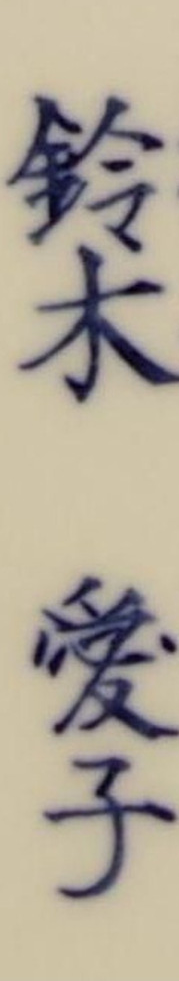鈴木愛子
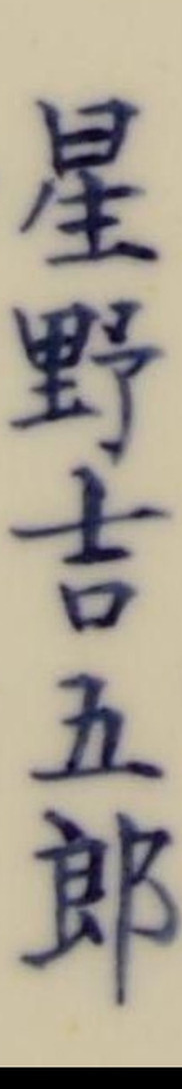星野吉五郎
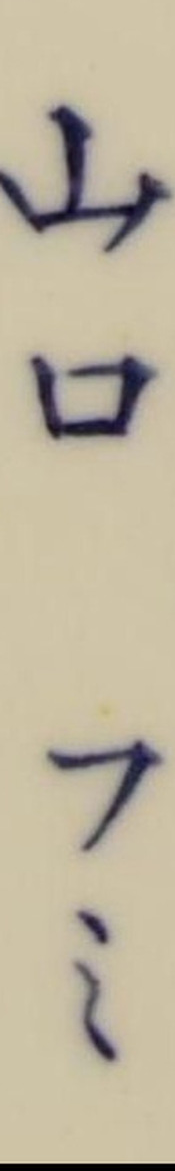山口フミ
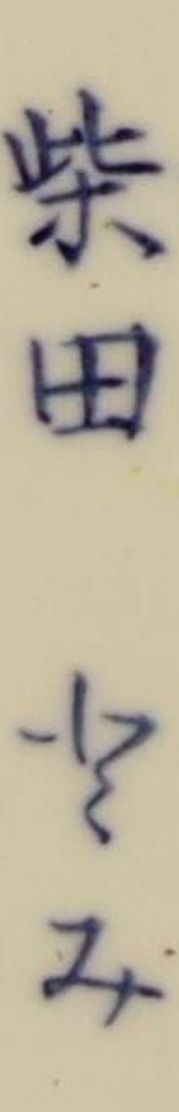柴田とみ
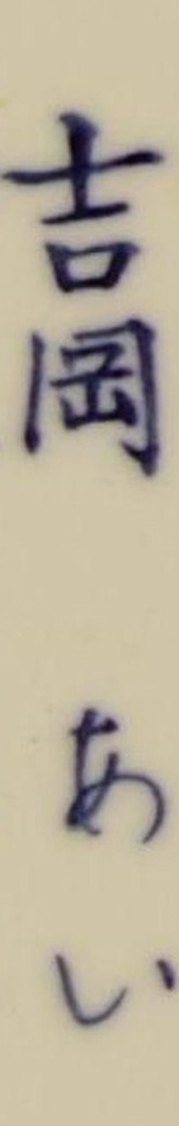吉岡あい
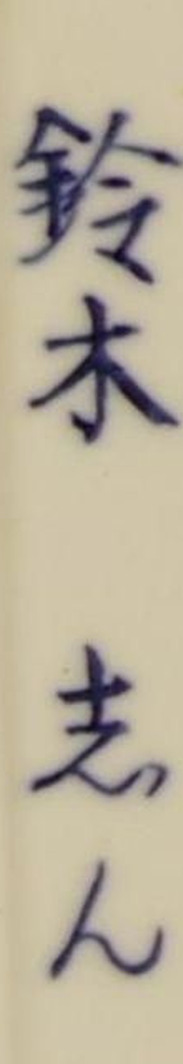鈴木しん

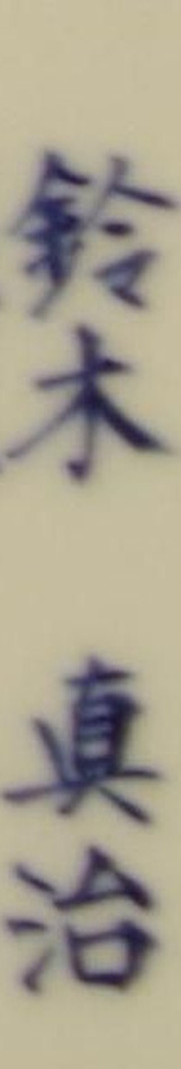鈴木真治
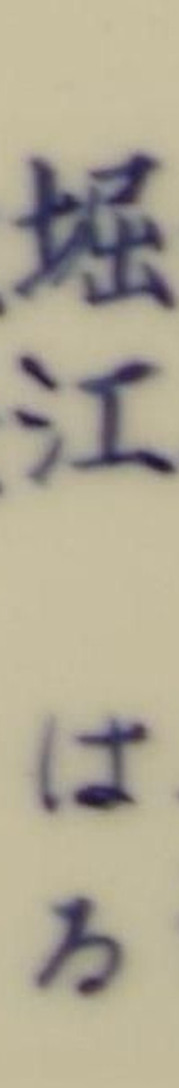堀江はる
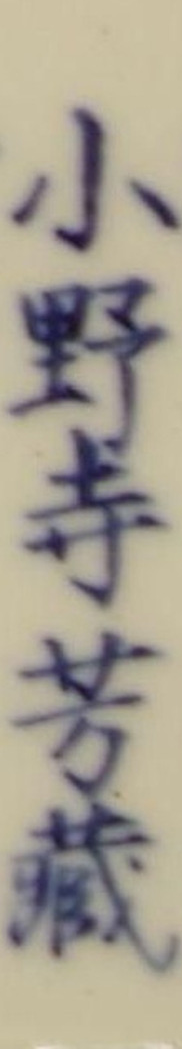小野寺芳蔵
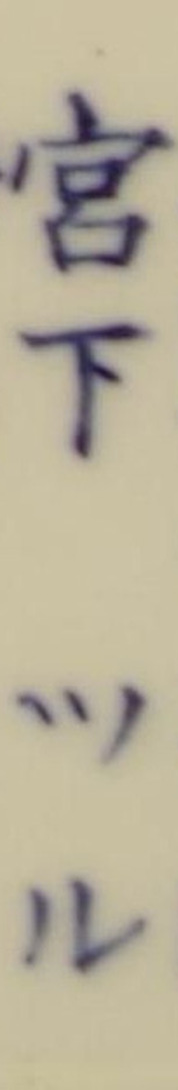宮下ツル
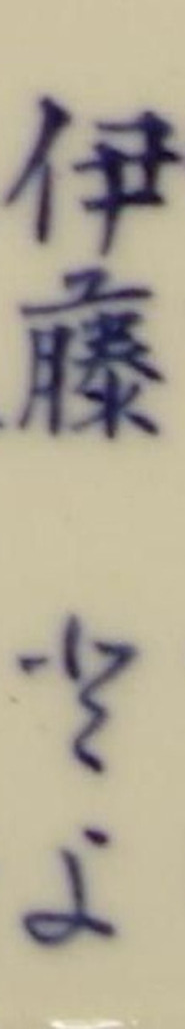伊藤とよ
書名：E~L
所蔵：高野山金剛峯寺
